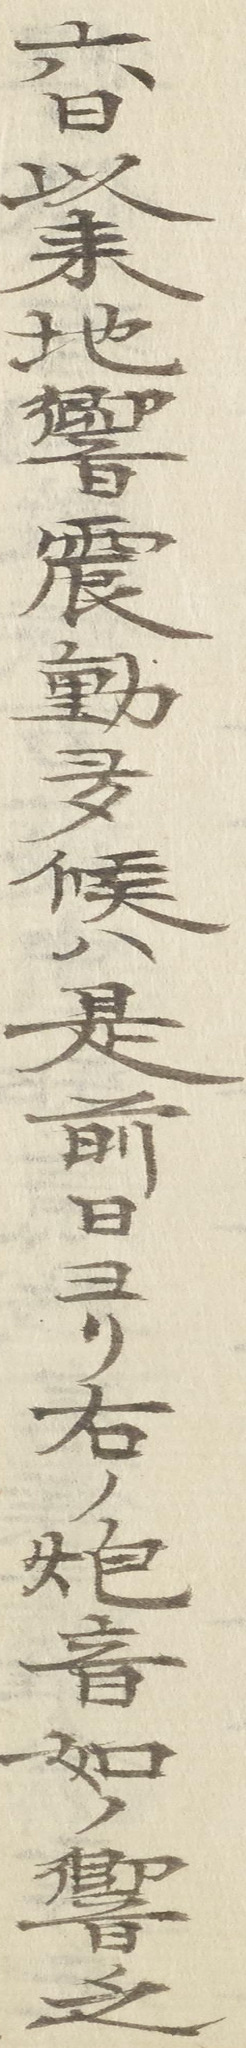六日以来地響震動多候は是前日より右の炮音如の響之
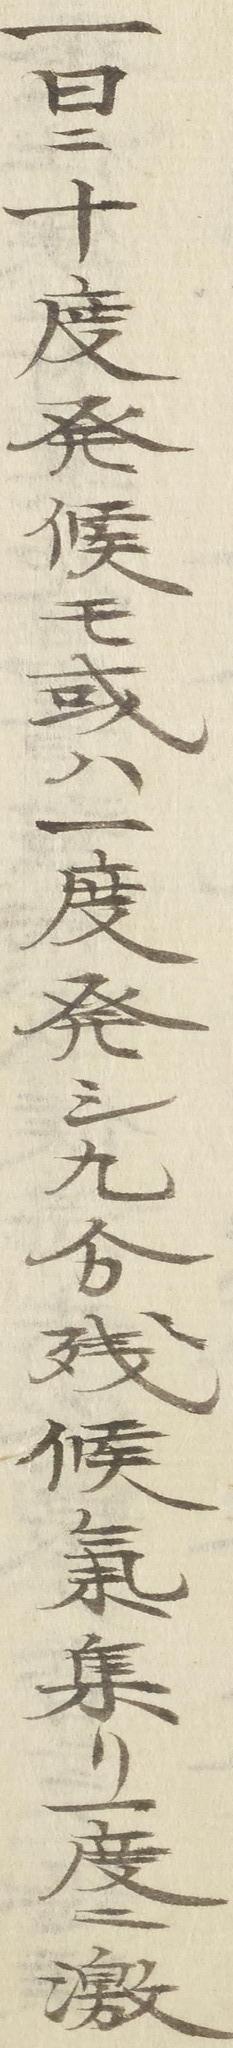一日に十度発候も或は一度発し九分残候気集り一度に激

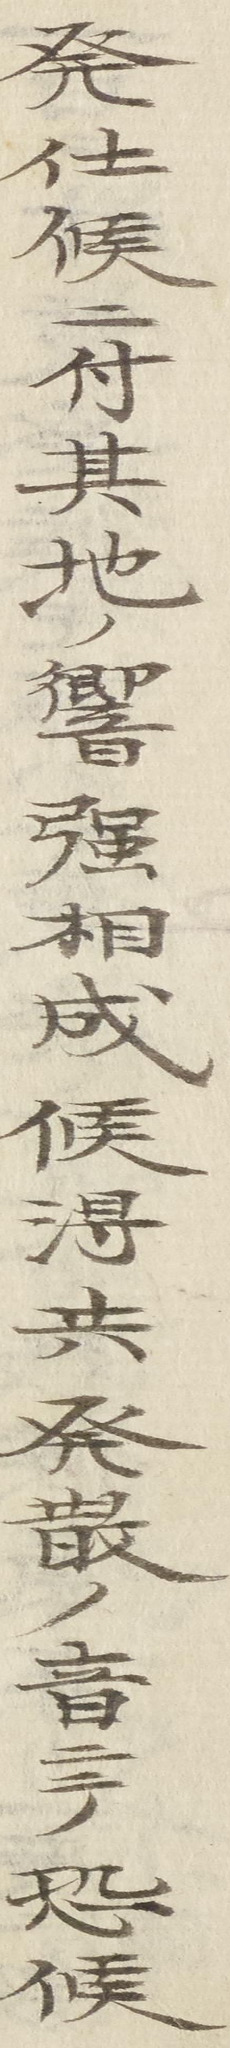発仕候に付其地の響強相成候得共発散の音にて恐候
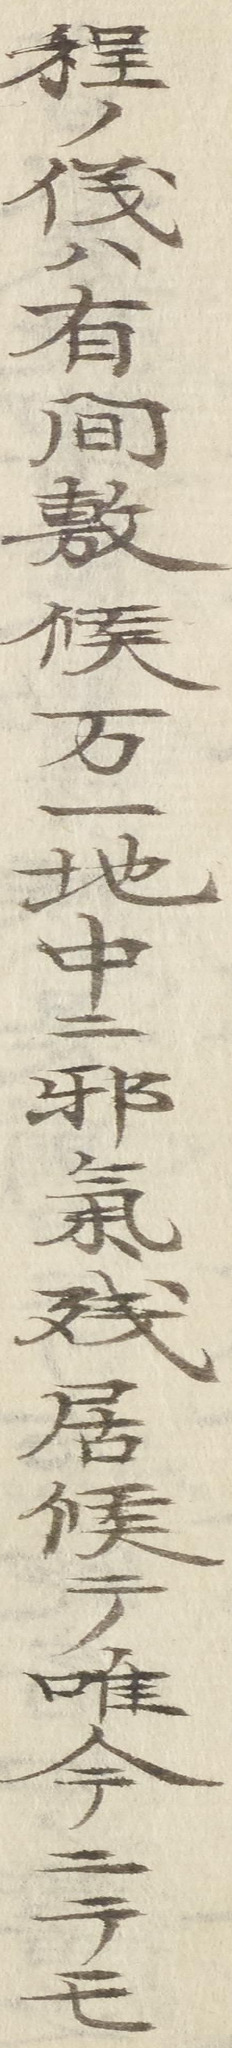程の儀は有間敷候万一地中に邪気残居候て只今にても
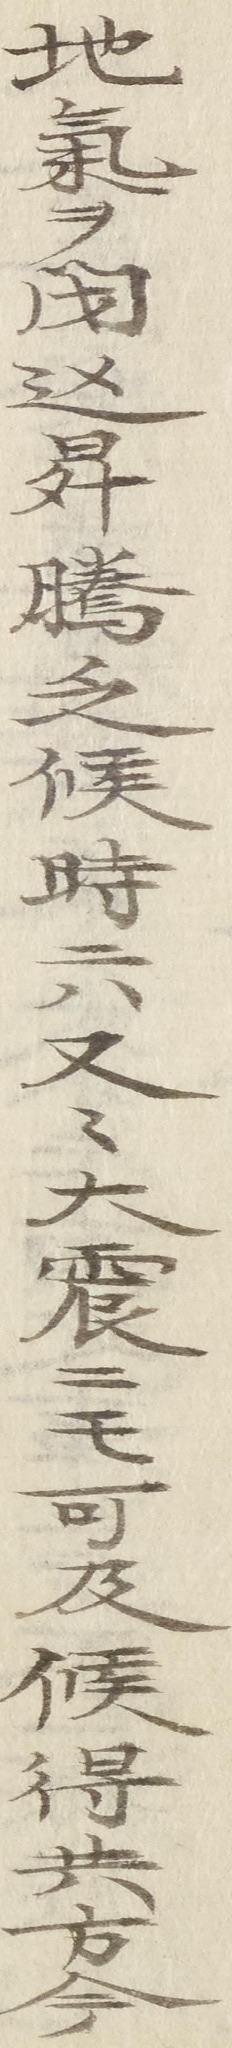地気を閉込昇騰乏候時には又々大震にも可及候得共方今
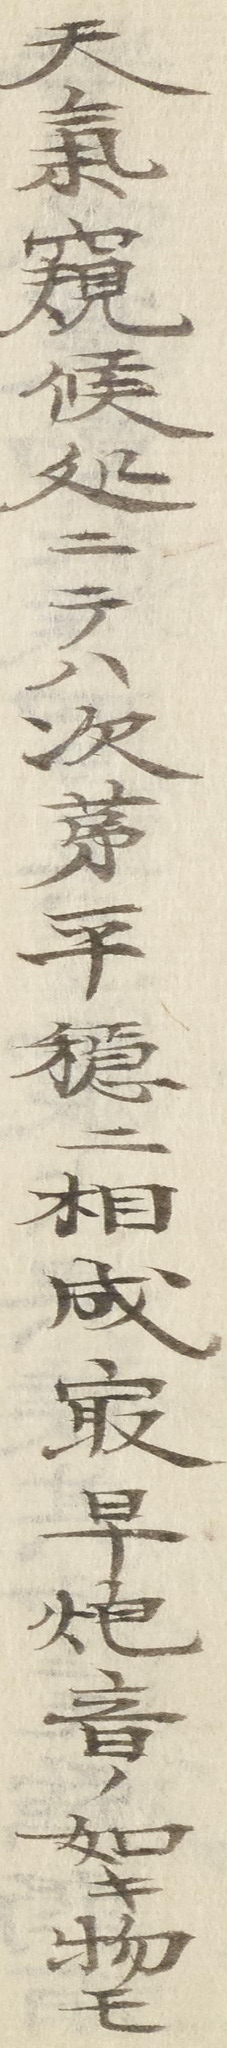天気窺候処にては次第平穏に相成最早炮音の如き物も
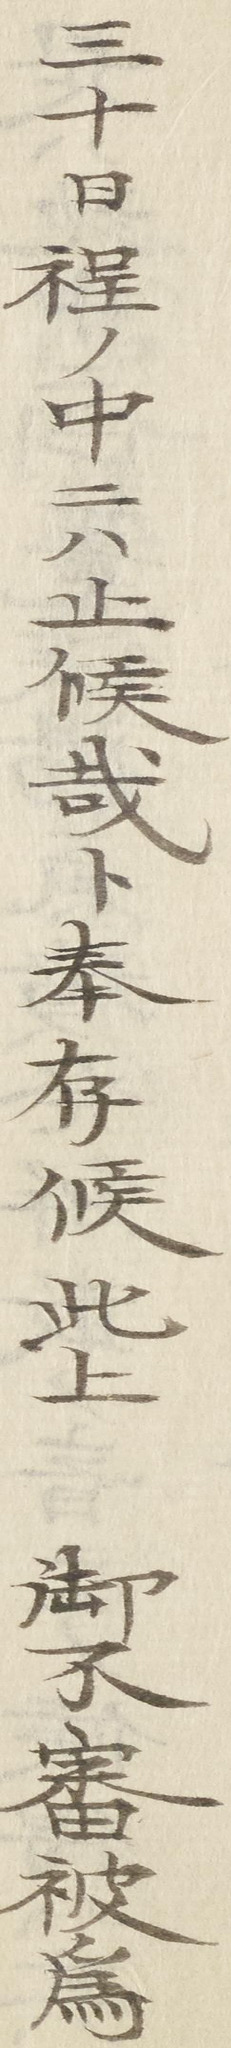三十日の中には止候哉と奉存候此上御不審被為
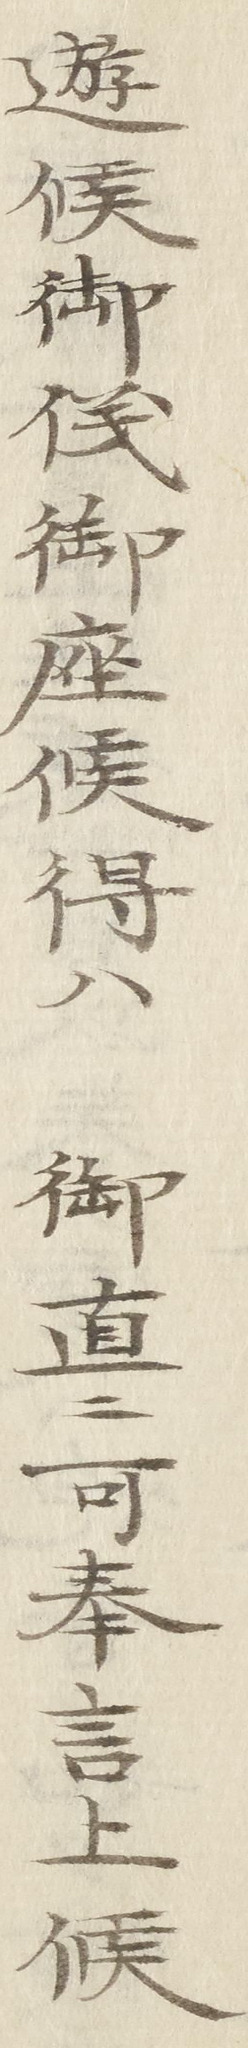遊候御儀御座候得は御直に可奉言上候
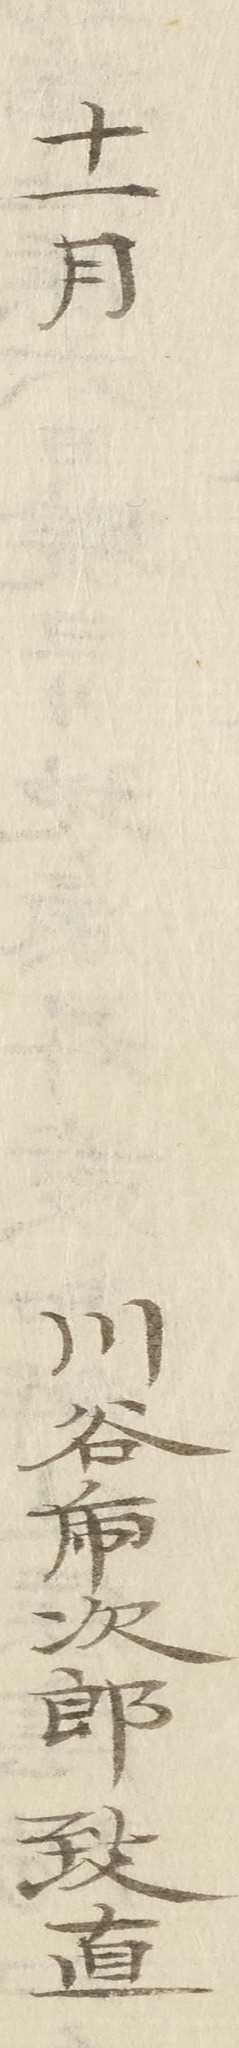十一月川谷虎次郎致直
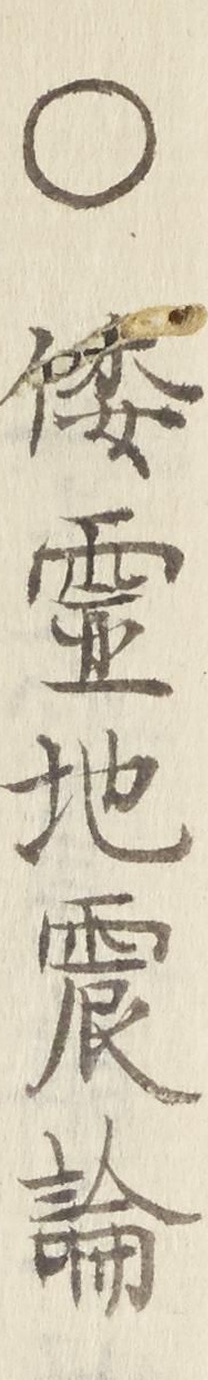◯倭霊地震論
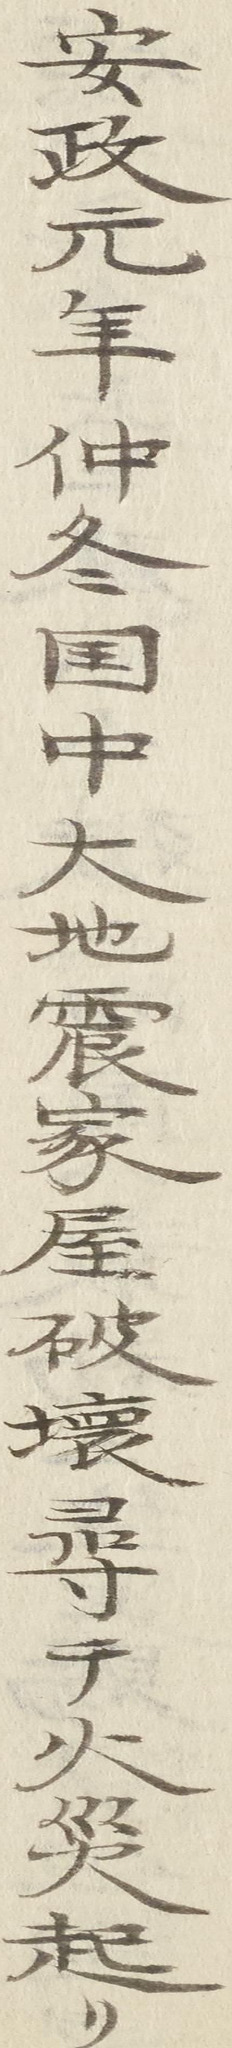安政元年仲冬国中大地震家屋破壊尋ち火災起り
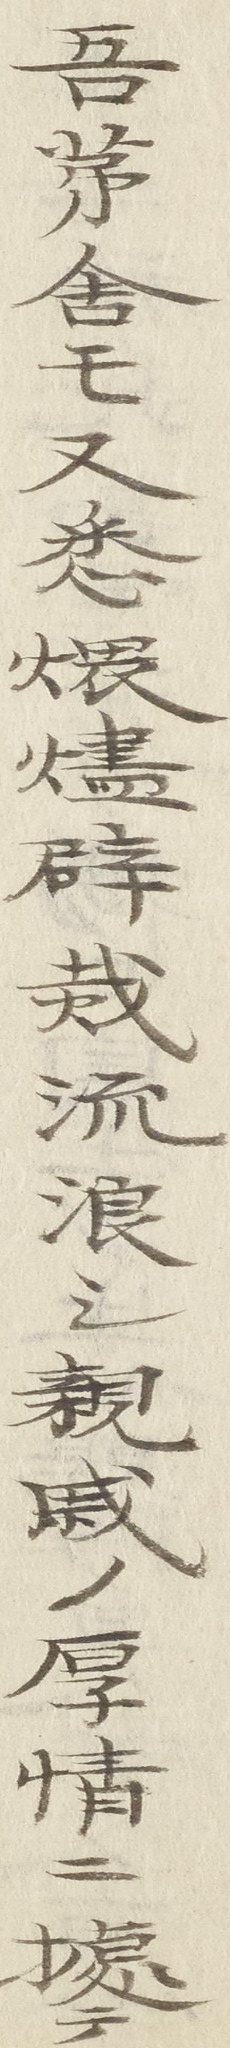吾茅舎も又悉煨燼辟烖流浪し親戚の厚情に拠て
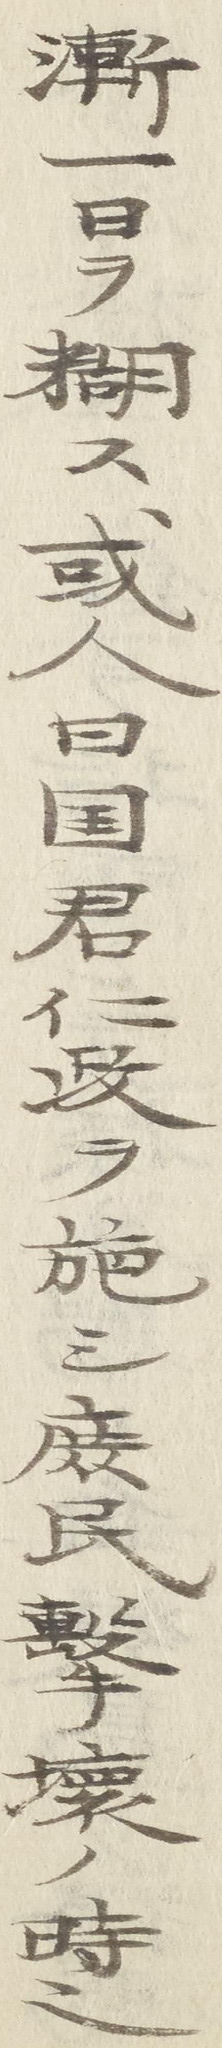漸一日を糊す或人曰国君仁政を施し庶民撃壊の時也
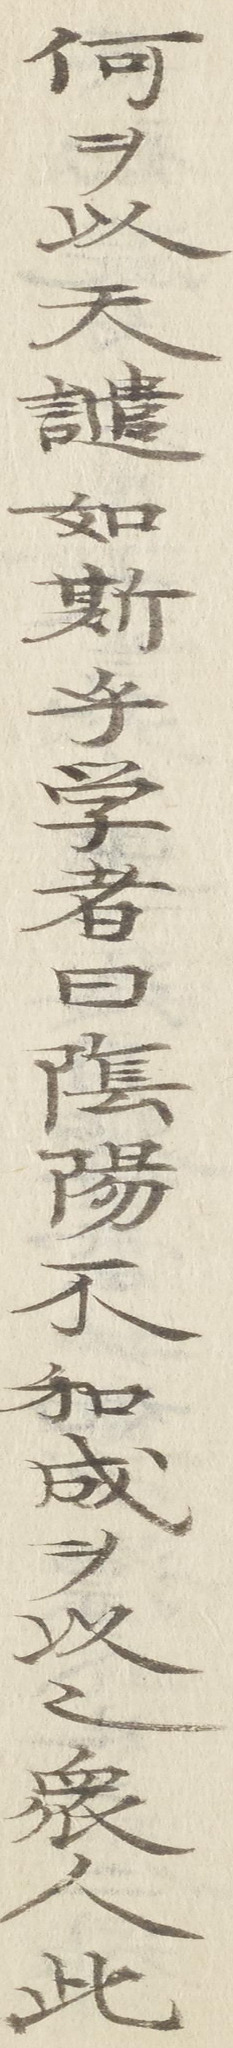何を以天譴如斯乎学者曰陰陽不和成を以也衆人此
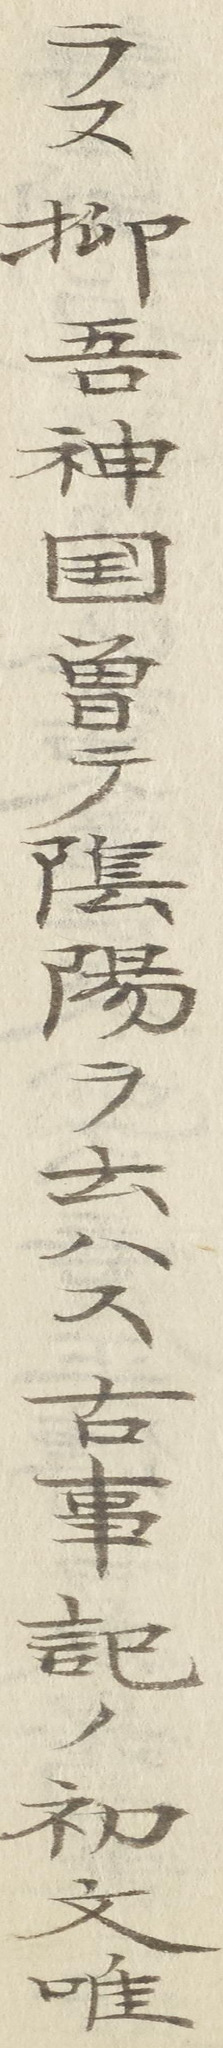らす抑吾神国曾て陰陽を云はす古事記の初文唯

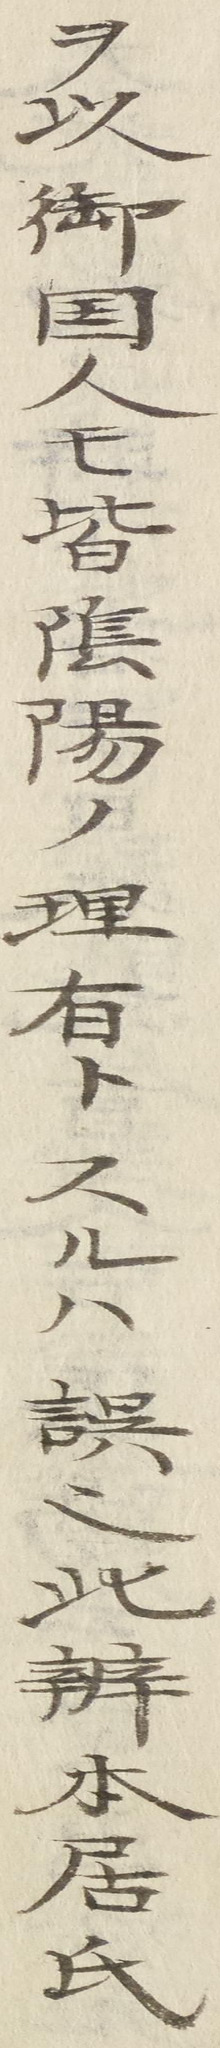を以御国人も皆陰陽の理有とすれは誤也此辨本居氏
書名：地震記　下
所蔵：東京大学地震研究所図書室 Earthquake Research Institute Library, The University of Tokyo, JAPAN
